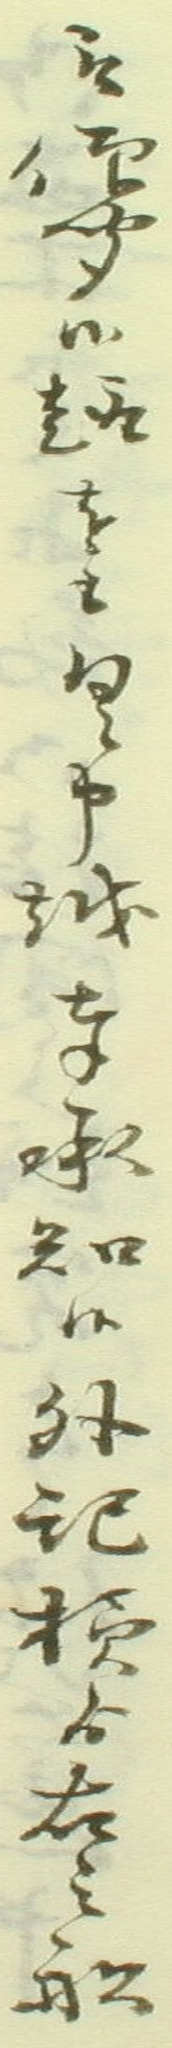被仰聞候趣をも具申越奉承知候外記様ゟ右之船
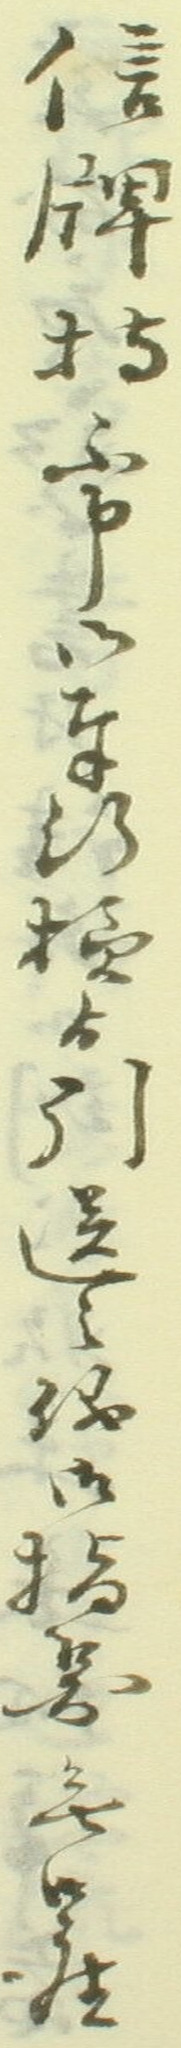信牌持不申御奉行様ゟ引送之儀御指図無御座
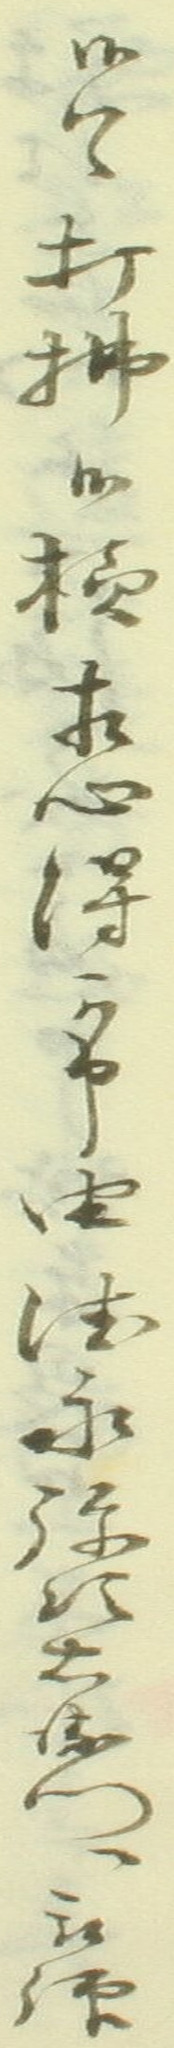候はゝ打払候様相心得可申由徳永弥次右衛門へ被仰
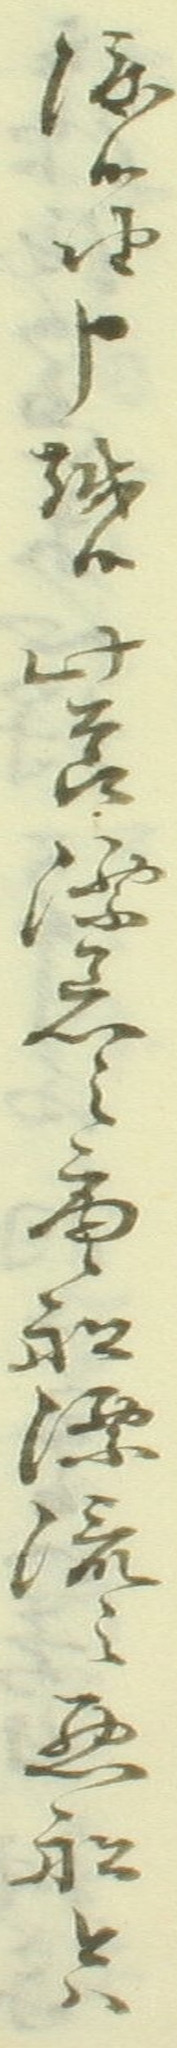渡候由申越候此節漂着之唐船漂流之悪船とは
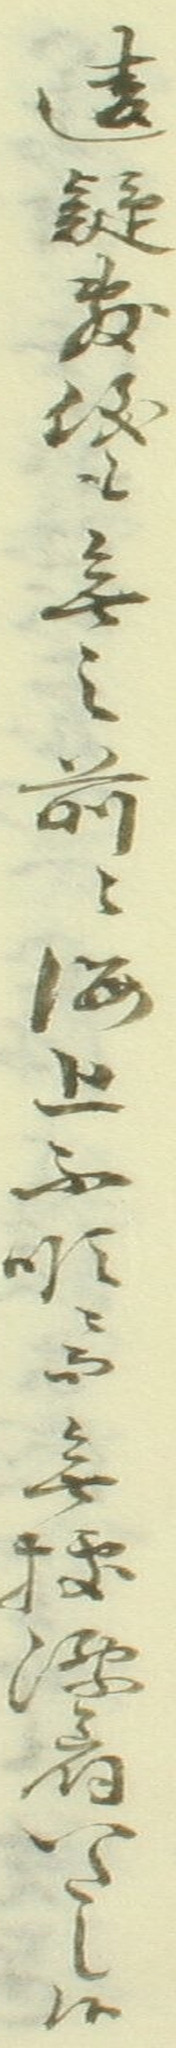違疑敷儀も無之前々海上不順に而無拠漂着いたし候
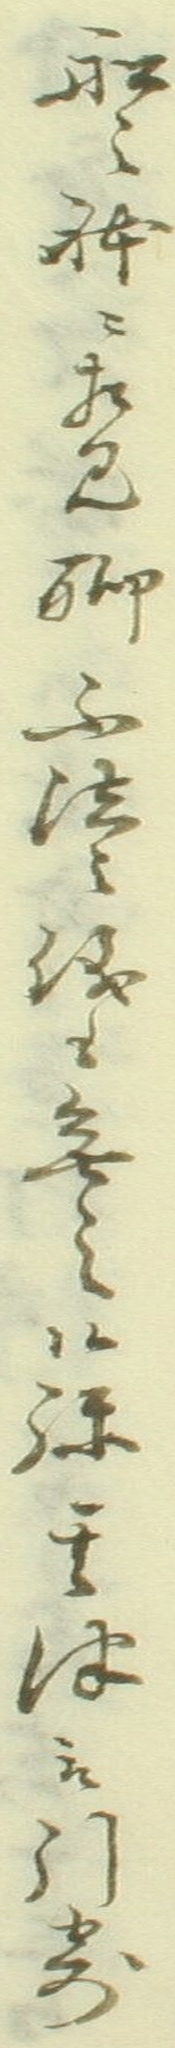船之躰に相見聊不法之儀も無之候弥其津え引寄
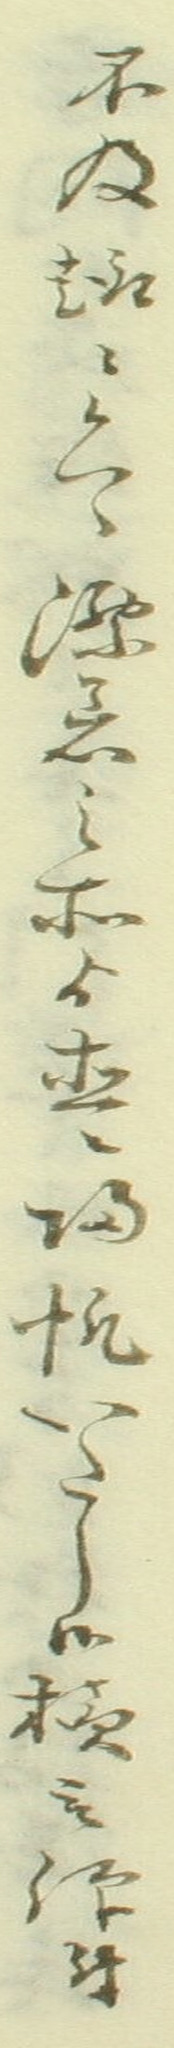不及趣に候はゝ漂着之所ゟ直に帰帆いたし候様被仰付
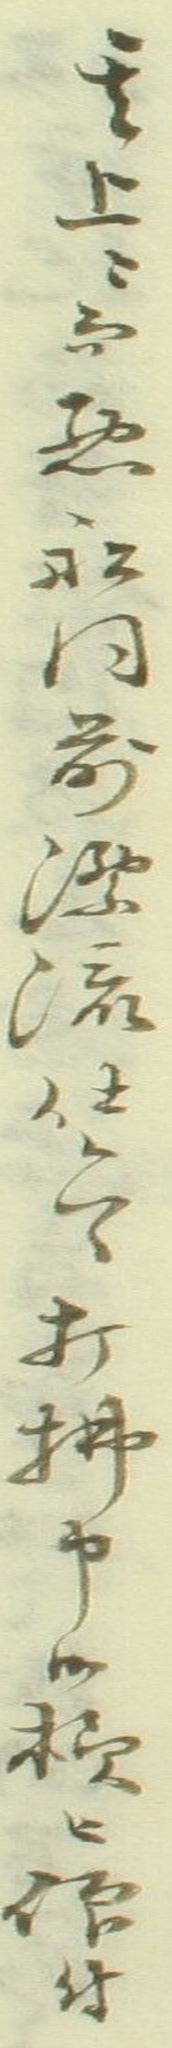其上に而悪船同前漂着仕候はゝ打払申候様被仰付
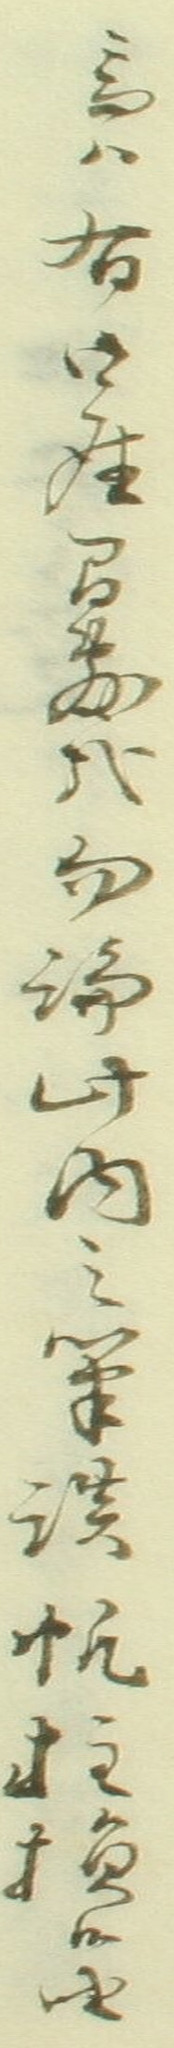に而は有御座間敷哉勿論此内之筆談帆柱損候由
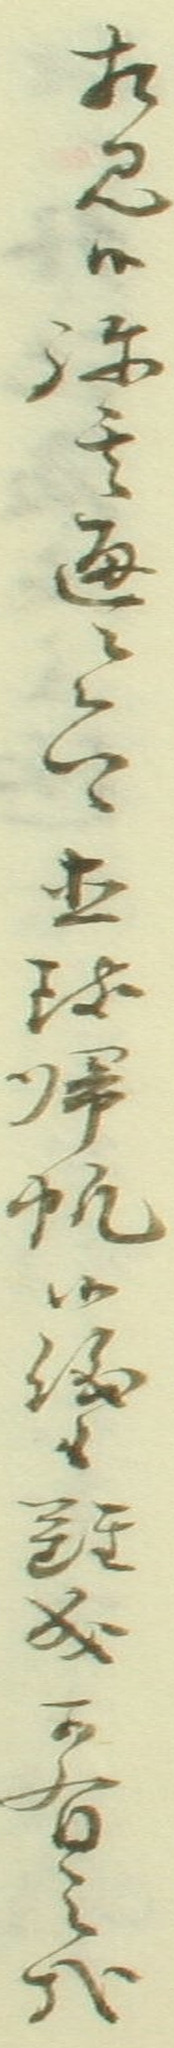相見候弥其通に候はゝ直致帰帆候儀も難成可有之哉
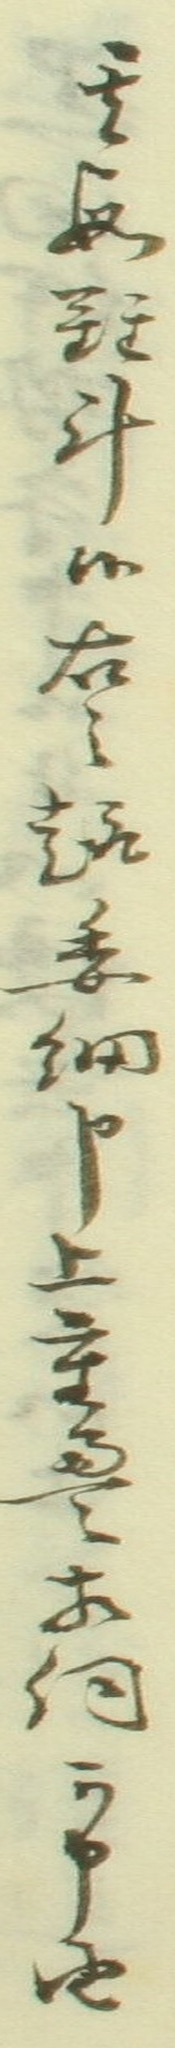其段難計候右之趣委細申上重畳相伺可申由

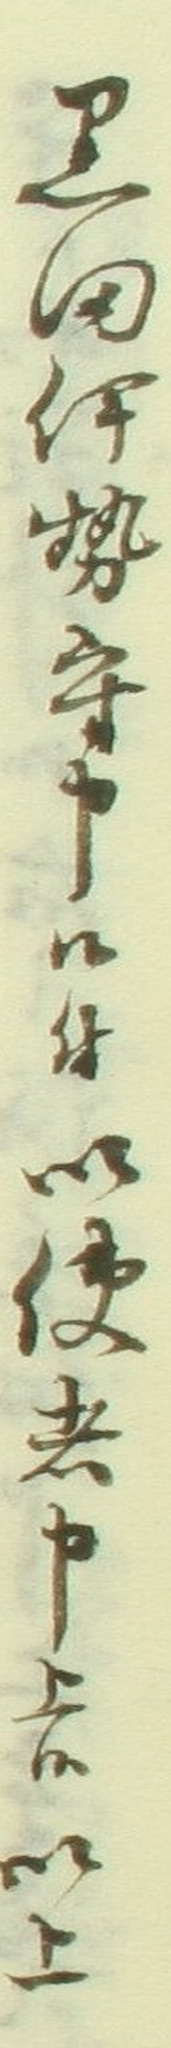黒田伊勢守申候付御使者申上候以上
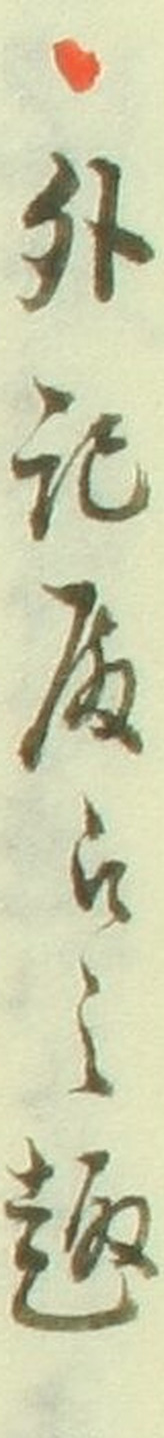外記殿え之趣
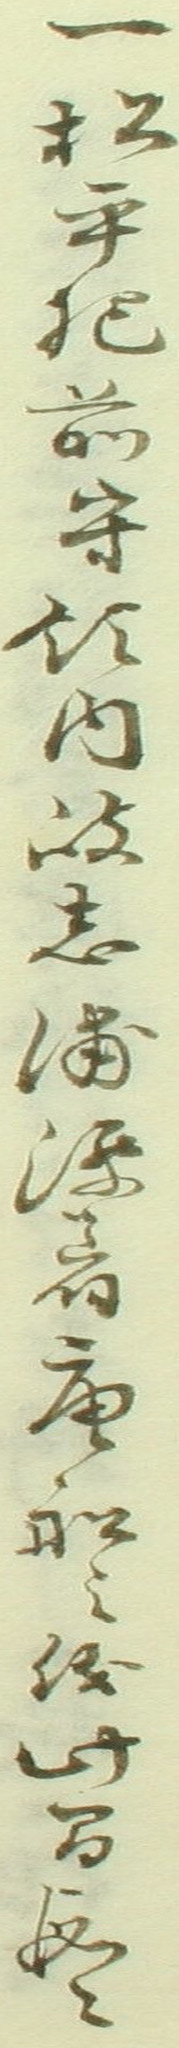一松平肥前守領内岐志浦漂着唐船之儀此間段々
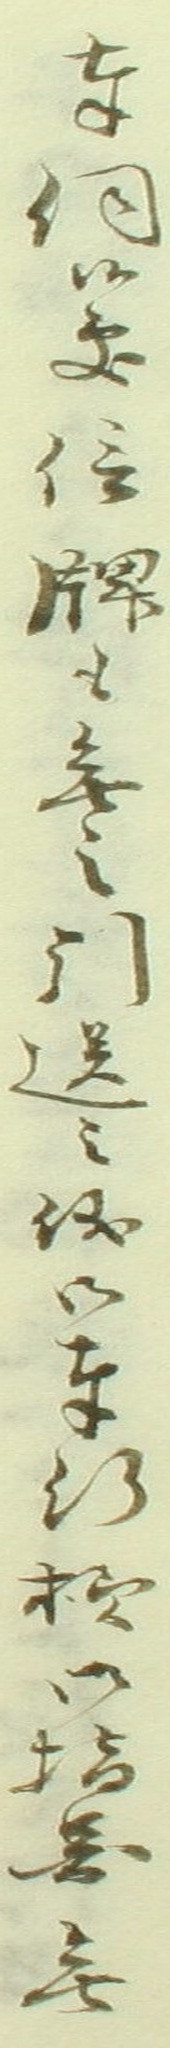奉伺候信牌も無之引送之儀御奉行様御指図無
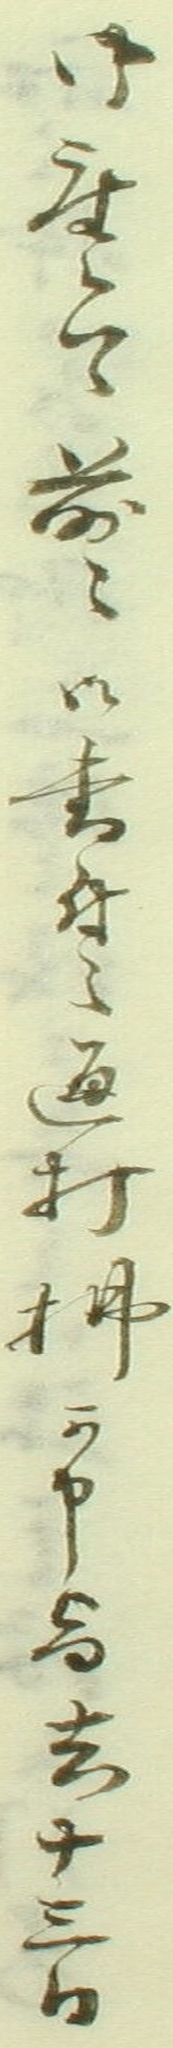御座候はゝ前々御書付之通打払可申旨去十三日
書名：異国船漂着記
